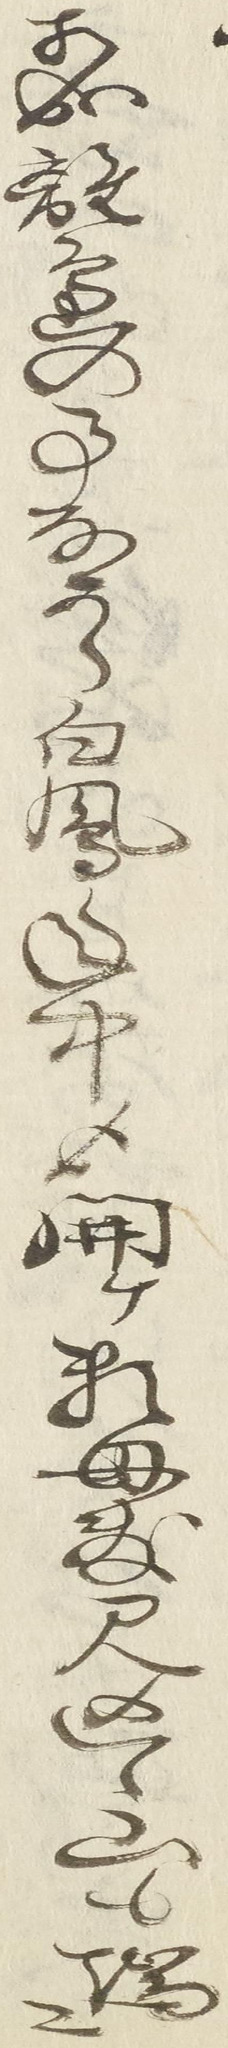相成離嶋の事なから白鳳年中ゟ開ヶ頼母敷見込候山も端に々
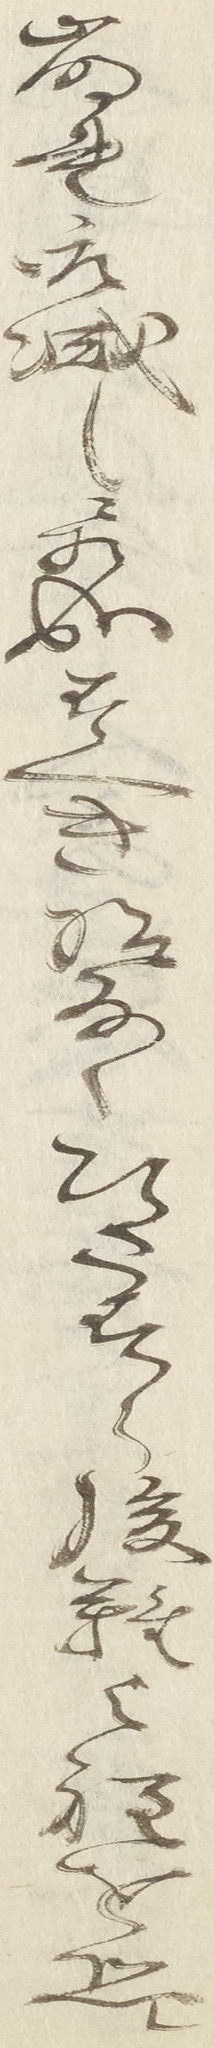崩れ被減しに相成すへき様なくひたすら後難之程を恐れ
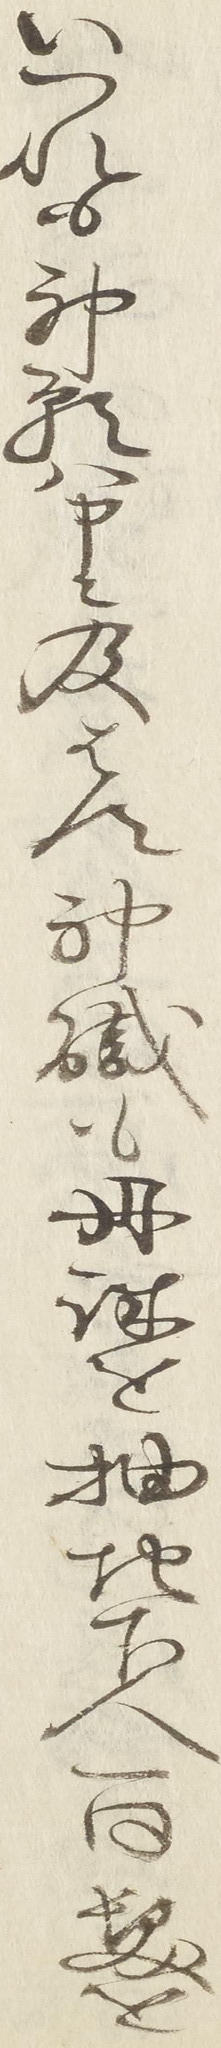いつれも神願は申に及はす神職も丹誠を抽地下人一同髪
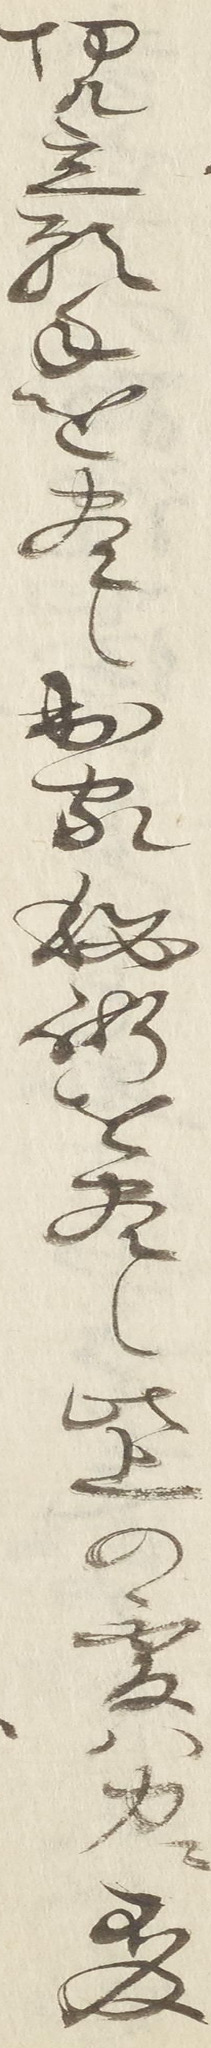切る立願手を尽し出家秘術を尽し此上の処は力に不及
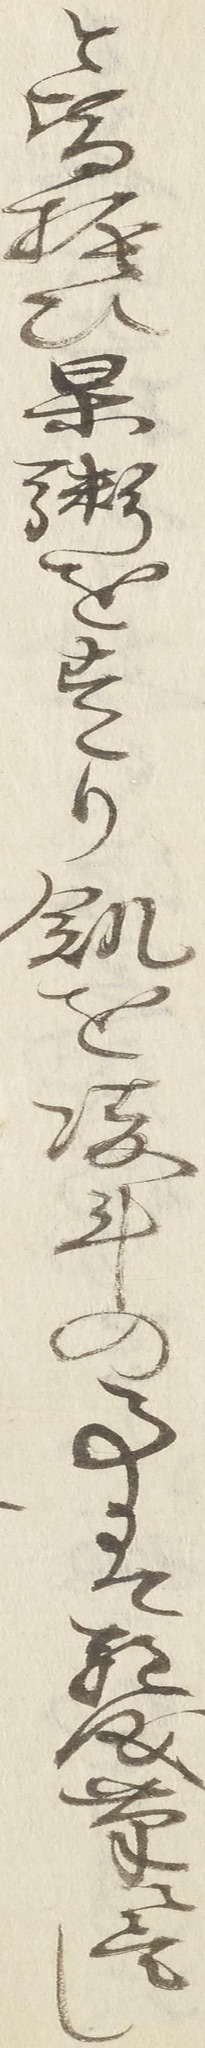と皆振ひ杲粥をすゝり飢を凌斗の事にて難儀筆に尽し
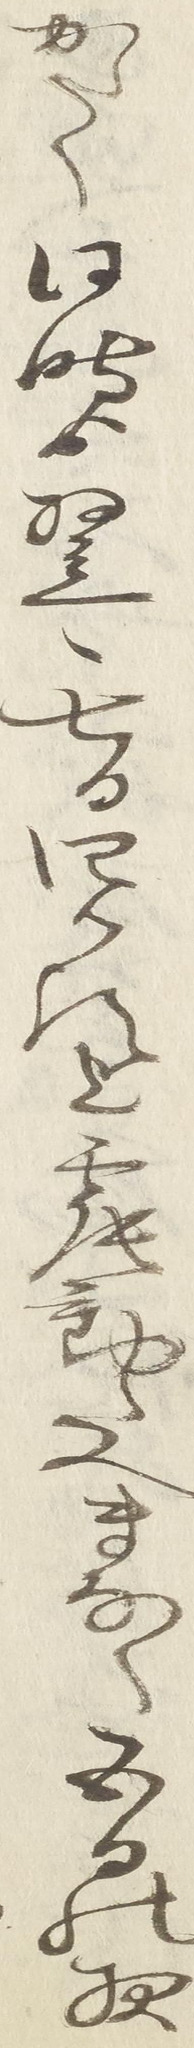かたく同時ゟ翌ゝ七日四ッ頃迄震動たへまなく五日の夜
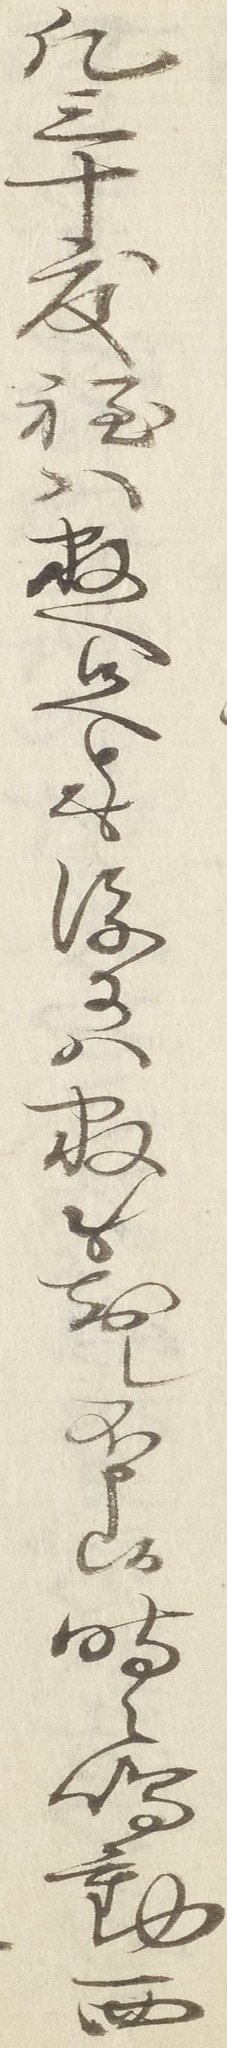凡三十度程は数へ候へとも後には数も知れ不申候時々鳴動西
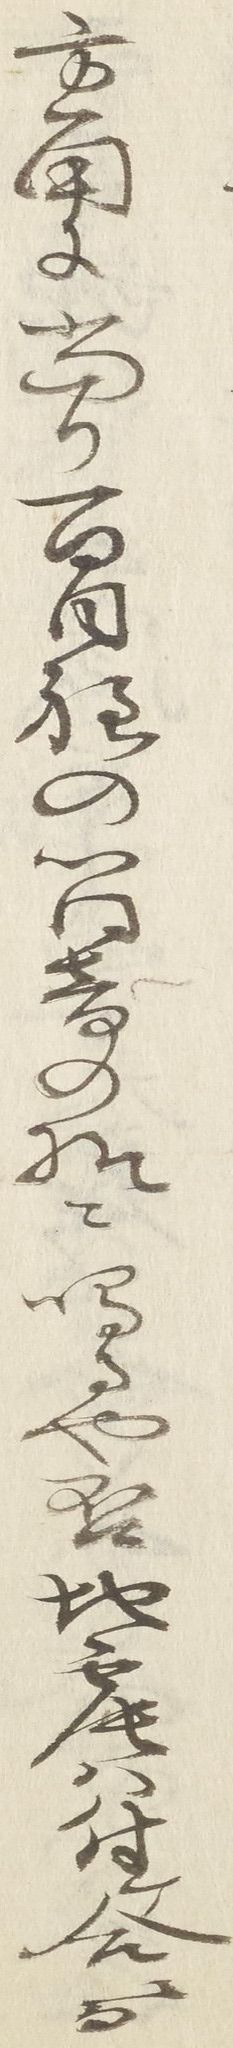方角に当り百目程の筒音の様に鳴るや否地震は付ヶ合二而
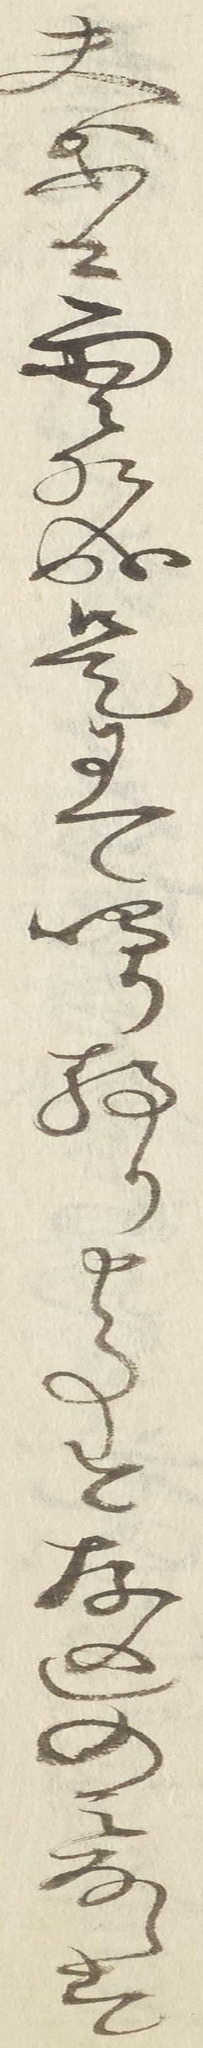夫ゟ少々雨に相成是まて鳴り降静り申事と存込のみならす
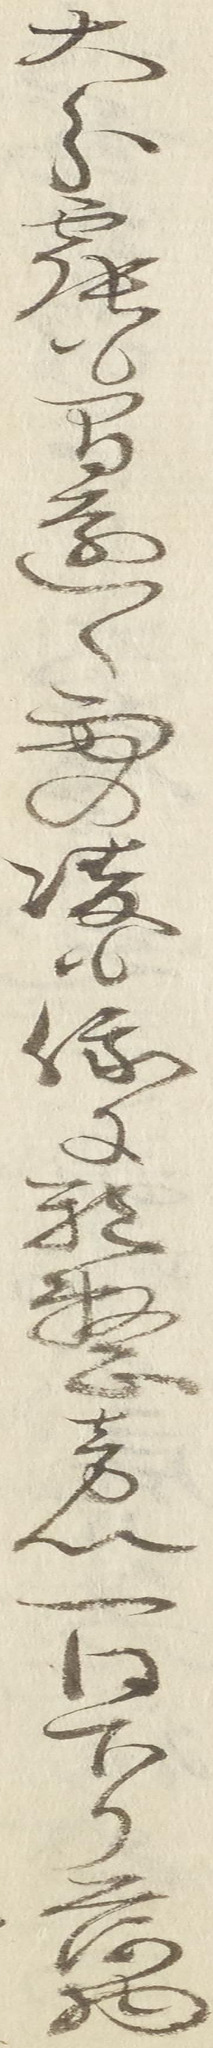大分震も間遠く雨の凌も俄に難整旁以一同下り荷物
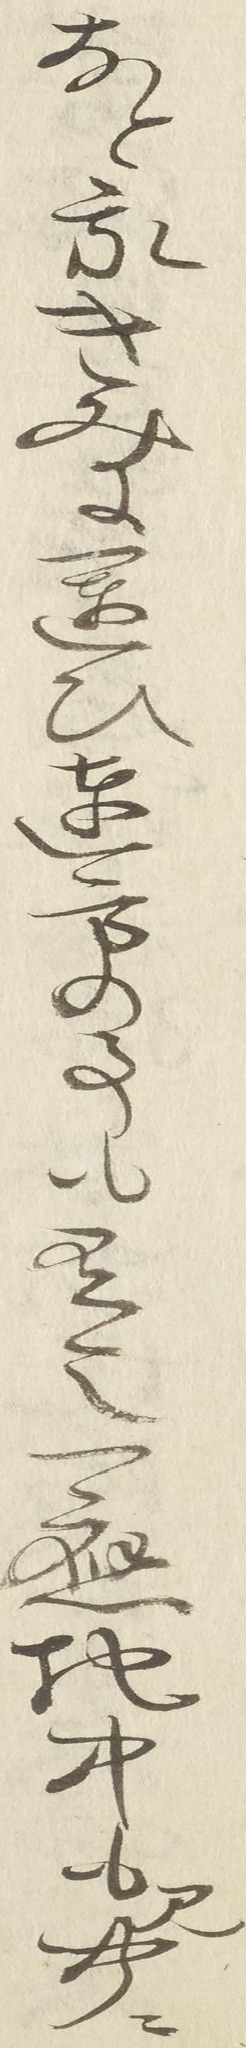なと我きみに運ひ達方の事も有之一応地中も見聞に

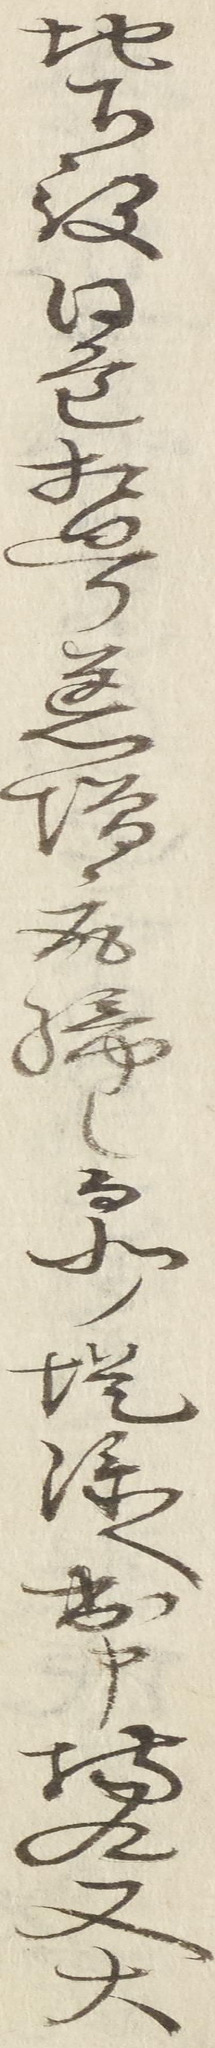地下役同道相廻り荒増取締しる北ノ堤除へ出申場合又大
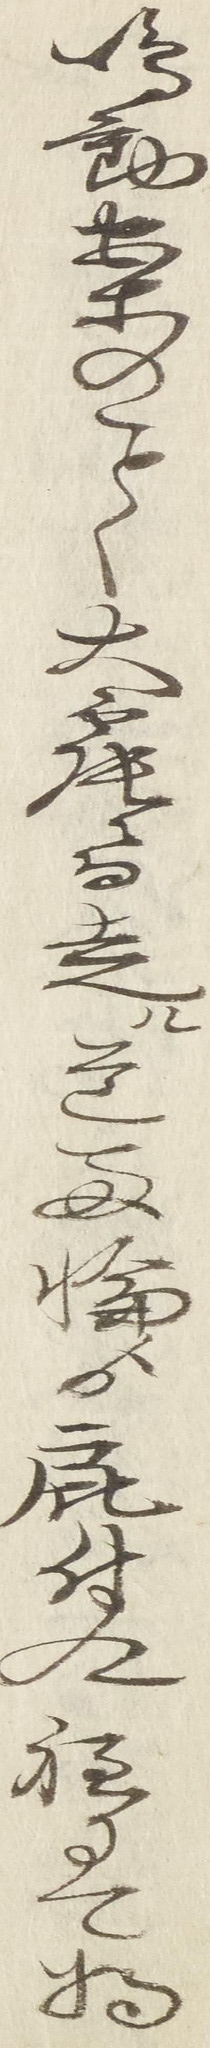鳴動案のことく大震二而走ㇽ道両輪ゟ屁付合程にて将
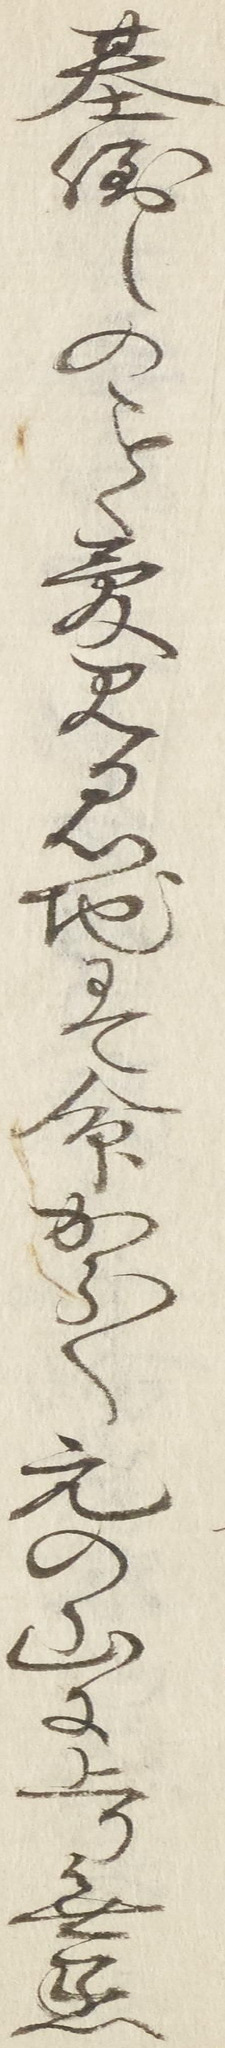基倒しのことく夢見る心地にて命から〳〵元の山に上り無恙
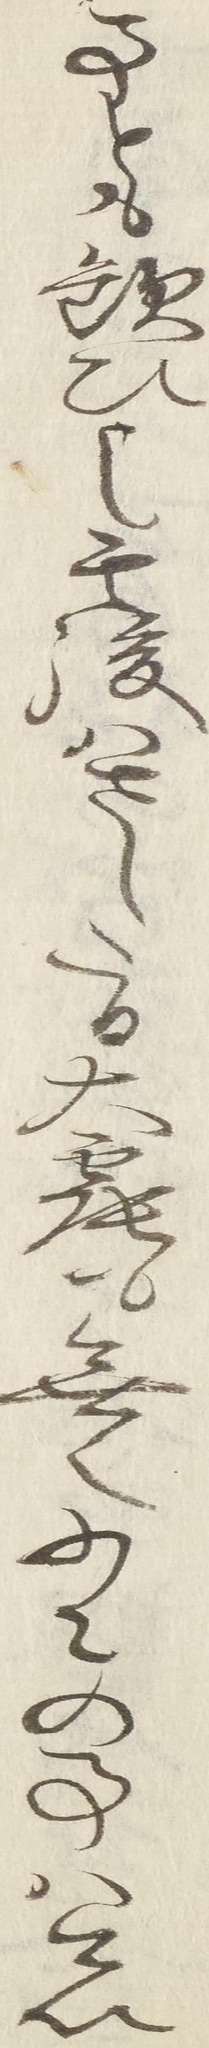事とも歓ひ申候其後はさしたる大震も無之少々の事は今以
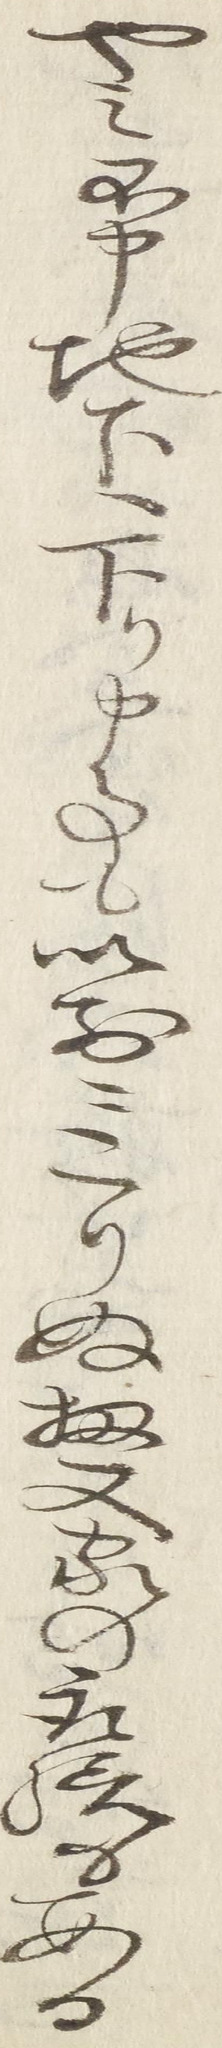やみ不申地下へ下り申事も以前にこりぬ扨又家の取繕もある
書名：地震記　下
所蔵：東京大学地震研究所図書室 Earthquake Research Institute Library, The University of Tokyo, JAPAN
